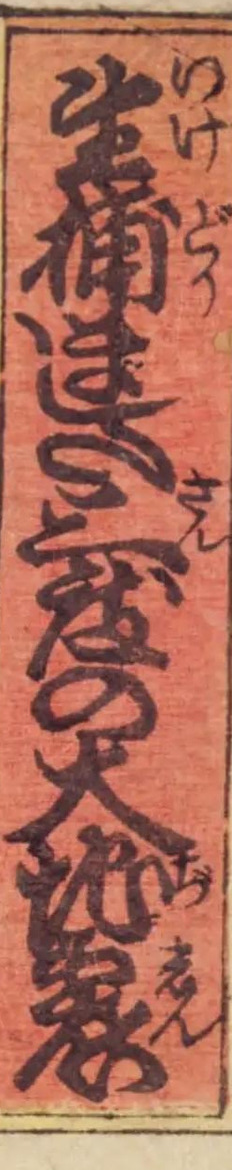生捕ました三度の大地震
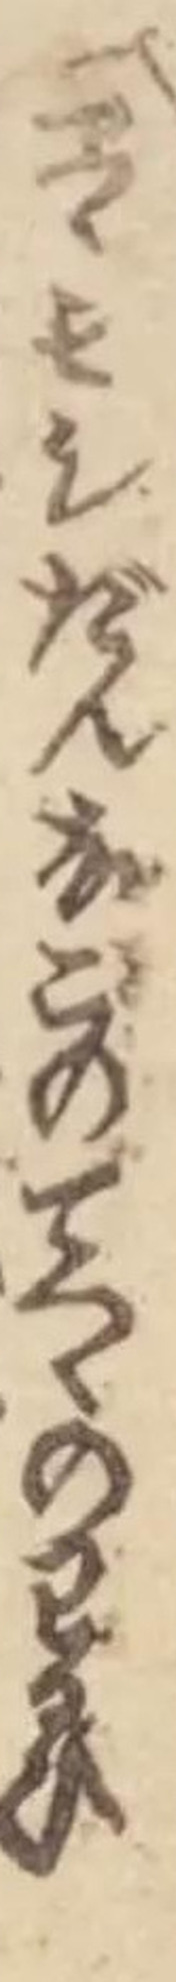「ヱヽもしだんなこのてへくのわるひ
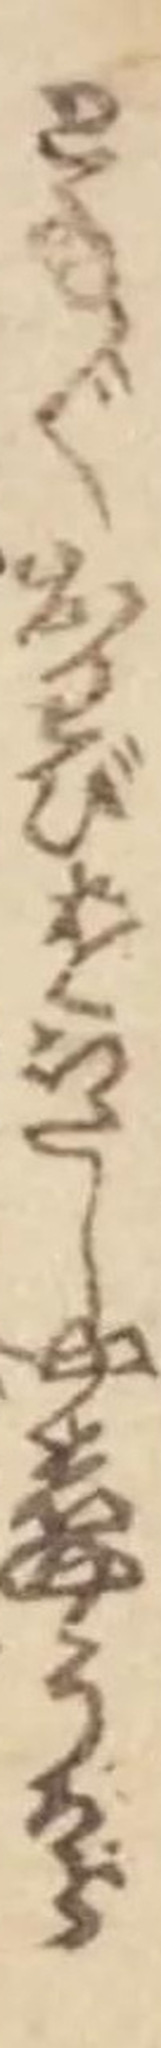とも〴〵おわびをいたしやしやうから
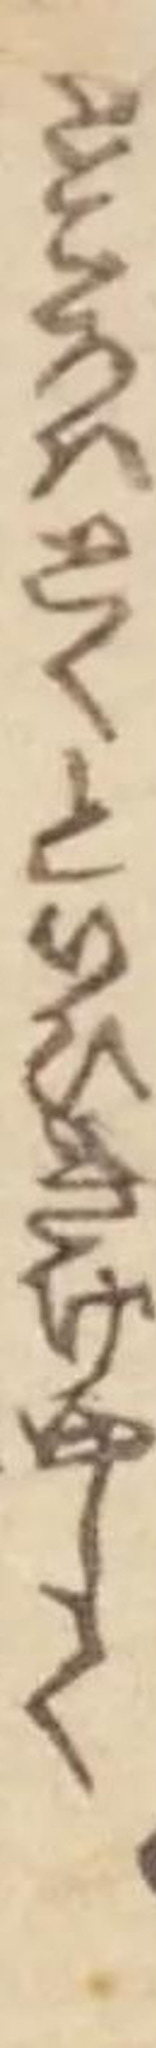ところはとくといひきけやして
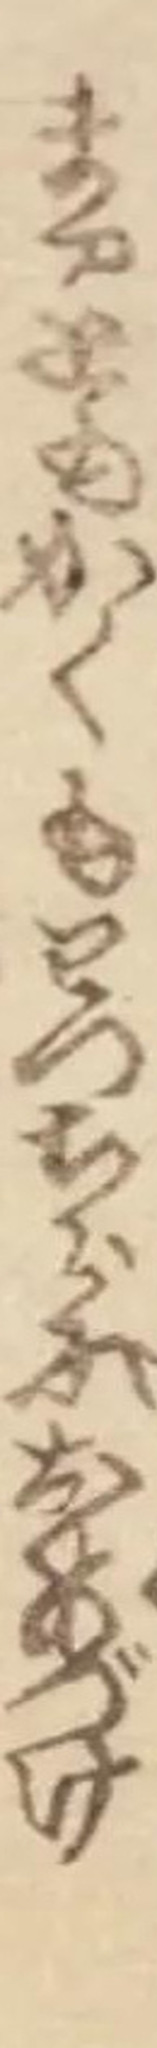まアともかくもわつちらにおあづけ
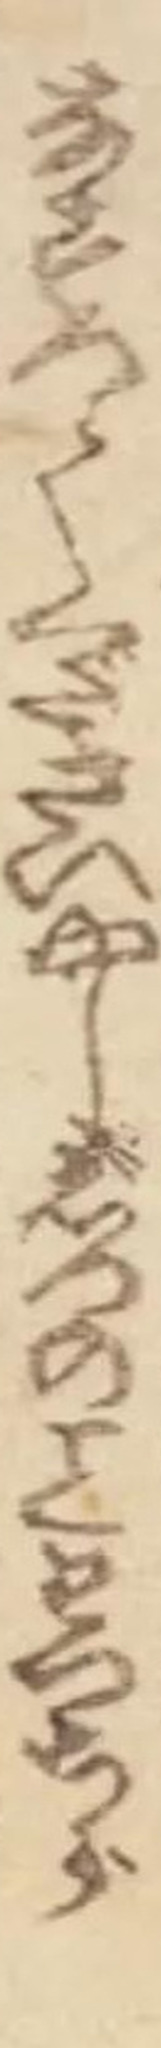なすつてくださいやしじつのことわつちら
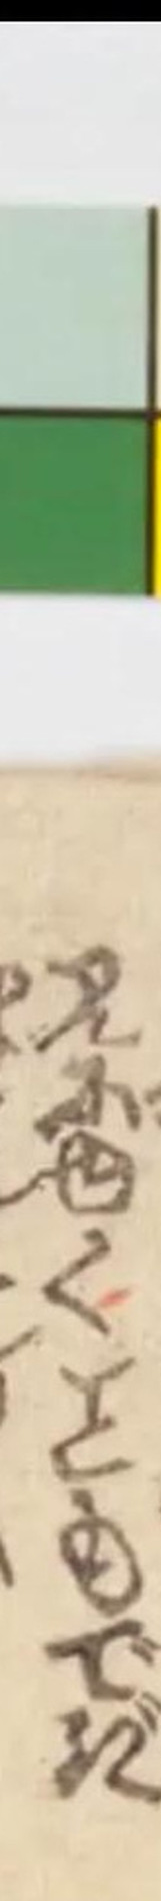見にゆくこともでぎ
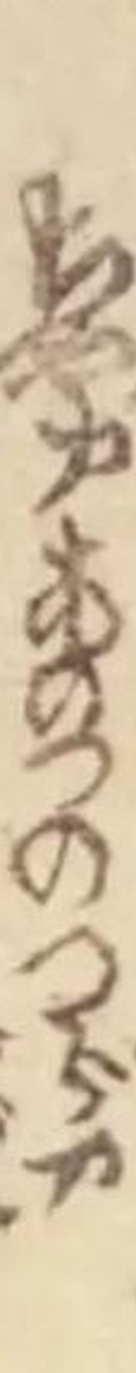ちやアあいつのつらア
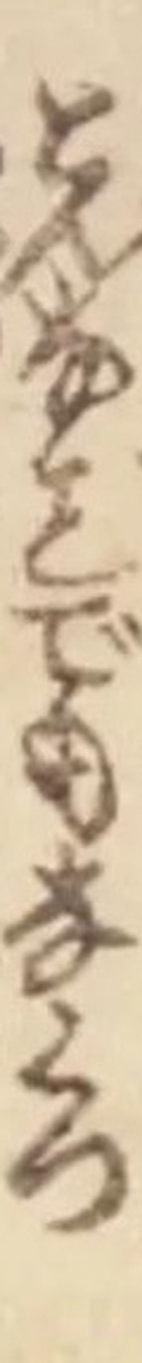とんなことでもなくつ
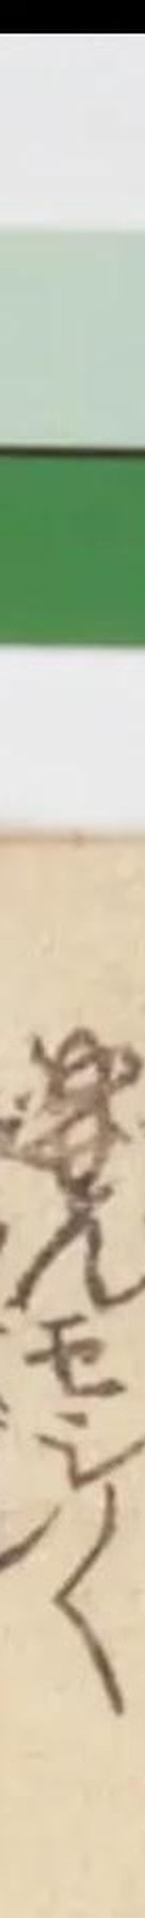やせんモシ〳〵
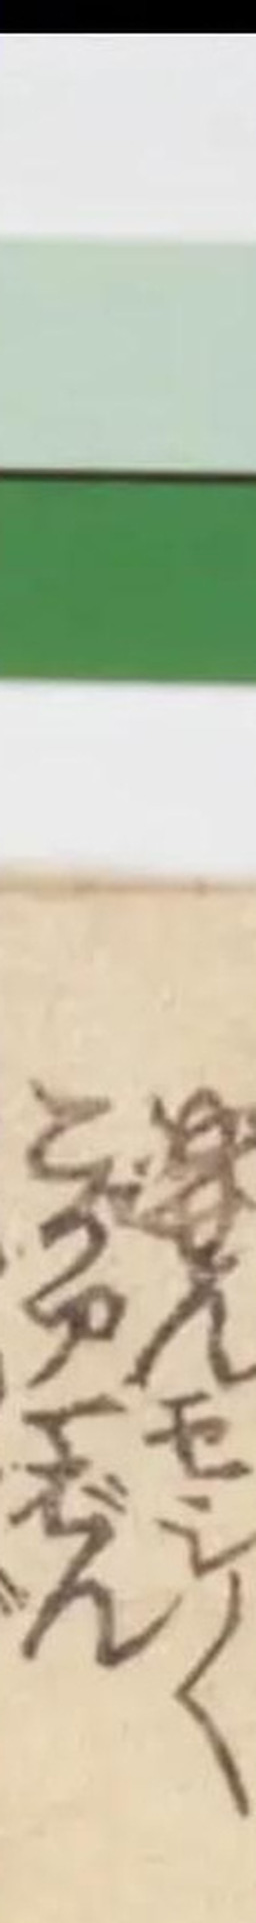こりア一ばん
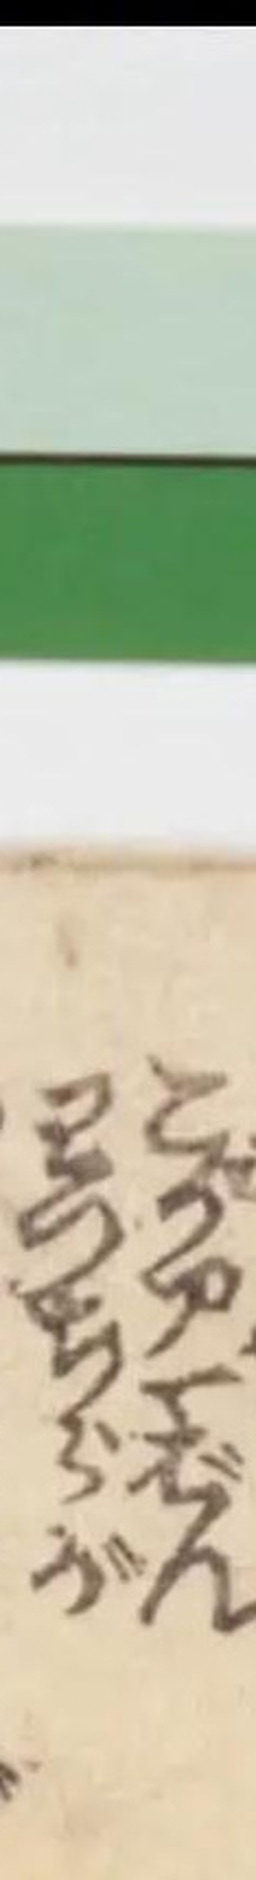わつちらが
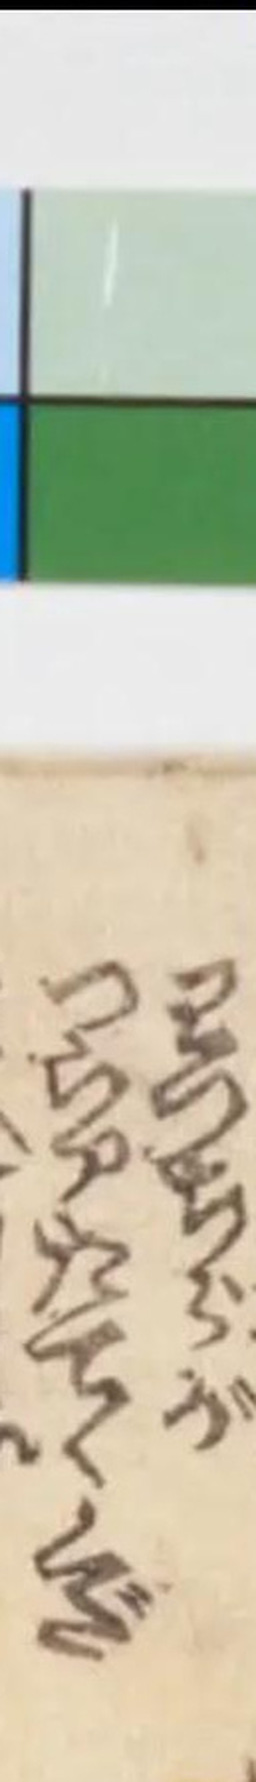つらアたてゝくだ
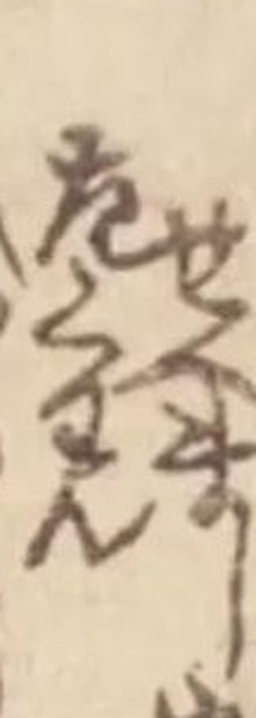左くわん
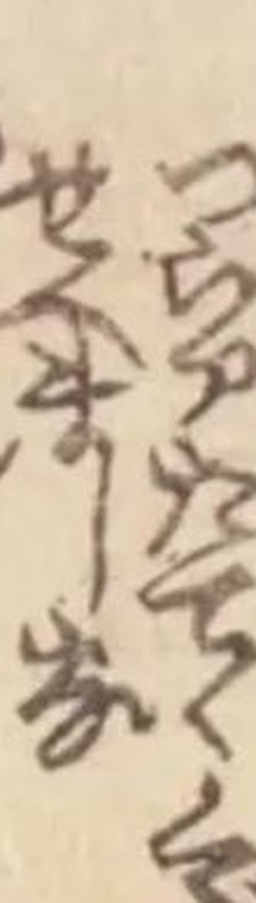せへましな
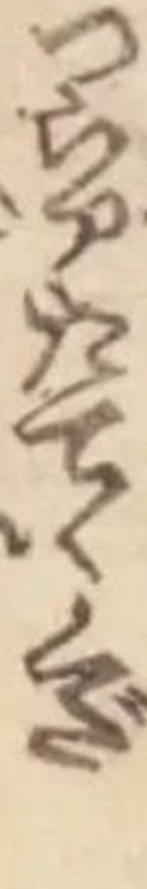つらアたてゝくだ
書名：生捕ました三度の大地震
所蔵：国立国会図書館 National Diet Library, JAPAN
